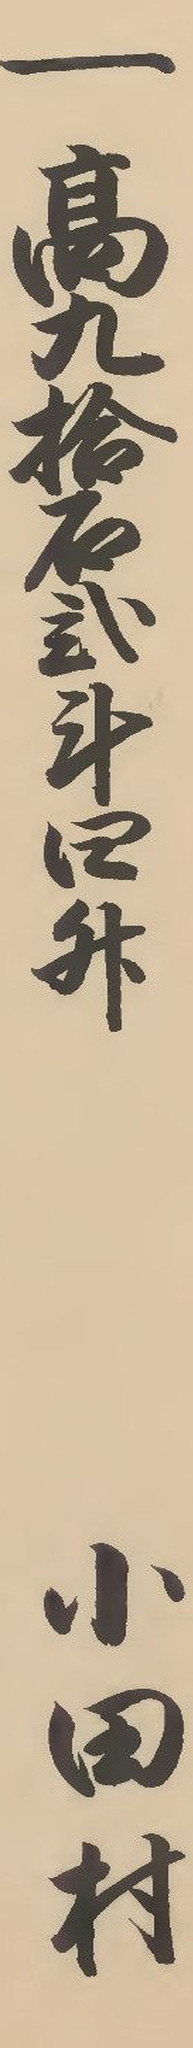一高九拾石弐斗四升小田村
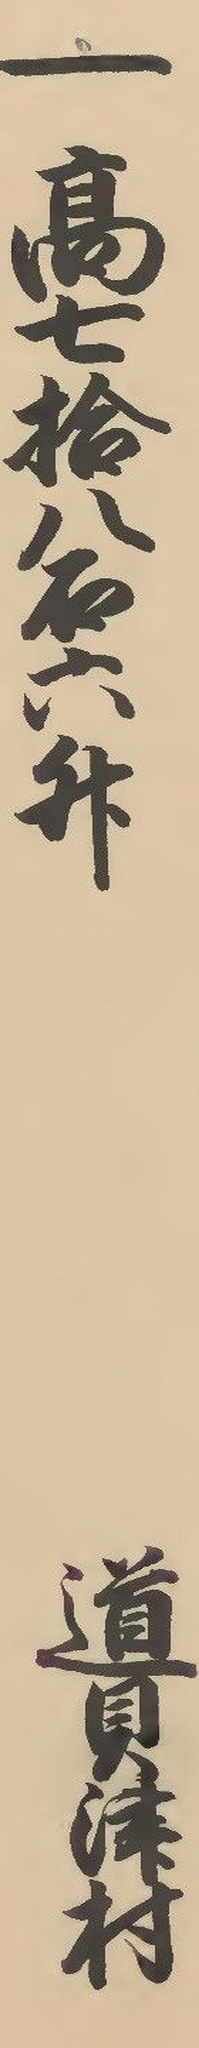一高七拾八石六升道貝津村

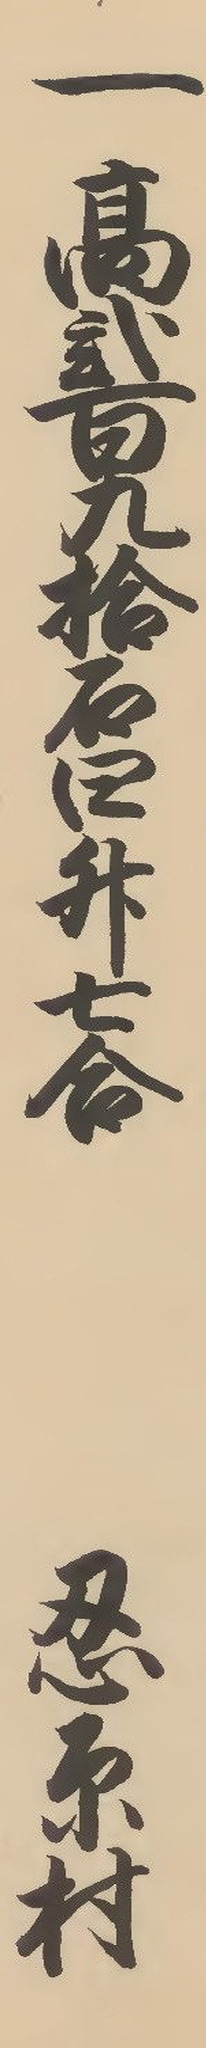一高弐百九拾石四升七合忍原村
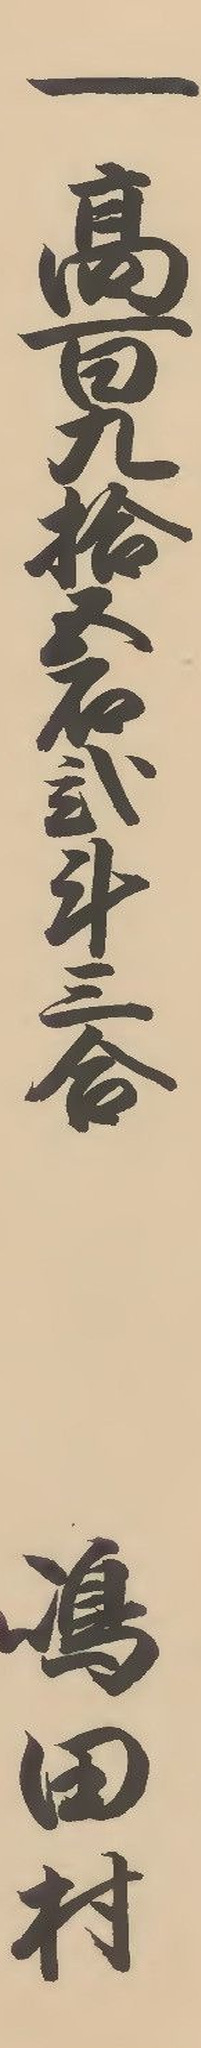一高百九拾五石弐斗三合島田村
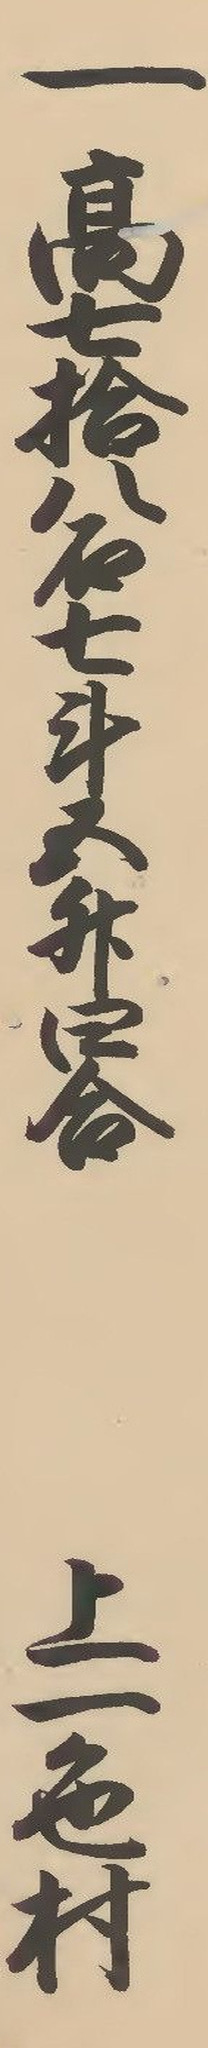一高七拾八石七斗五升四合上一色村
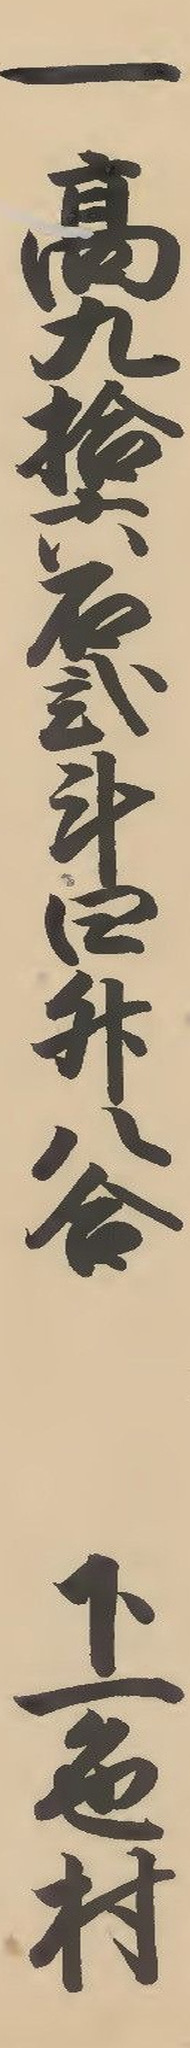一高九拾六石弐斗四升八合下一色村
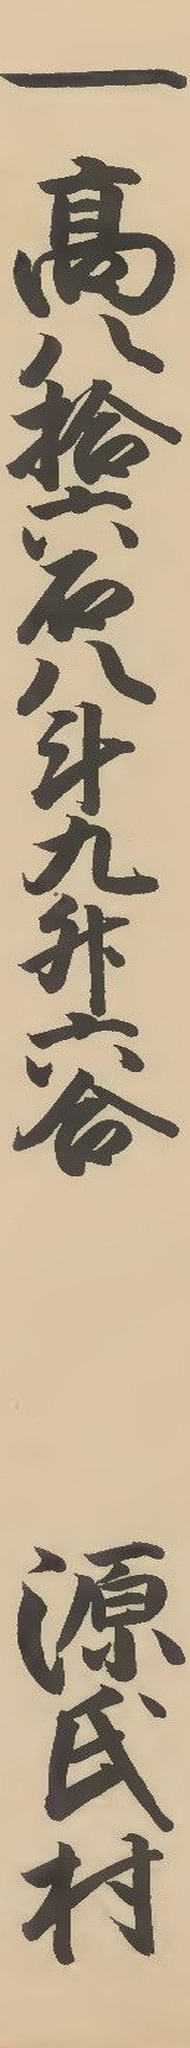一高八拾六石八斗九升六合源氏村
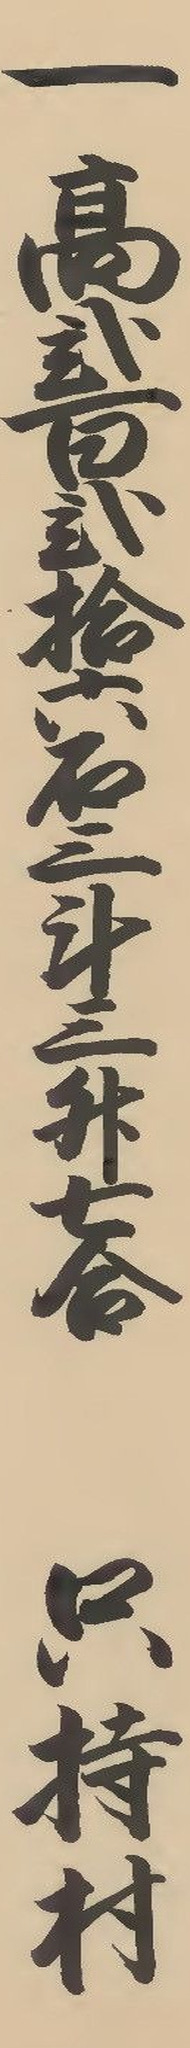一高弐百弐拾六石三斗三升七合只持村
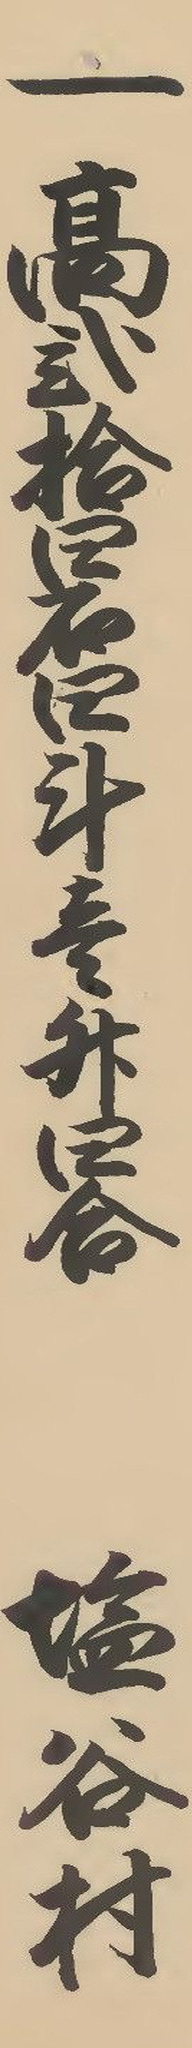一高弐拾四石四斗壱升四合塩谷村

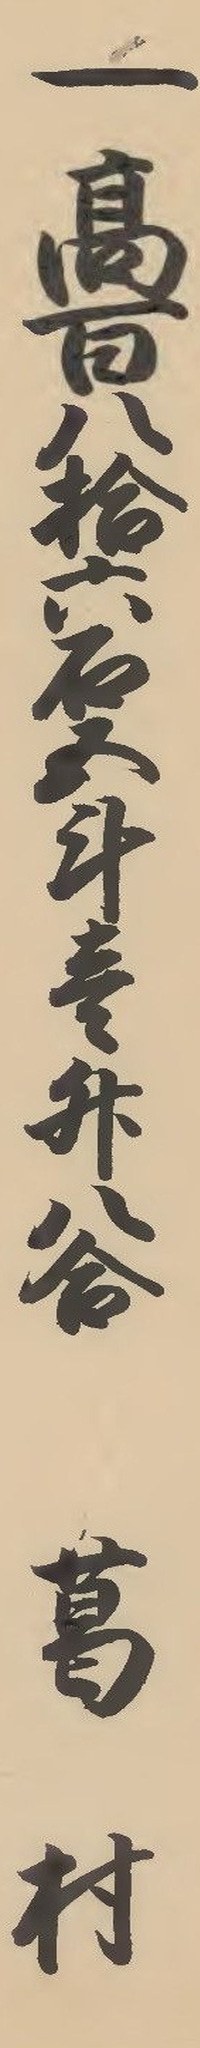一高百八拾六石五斗壱升八合葛村
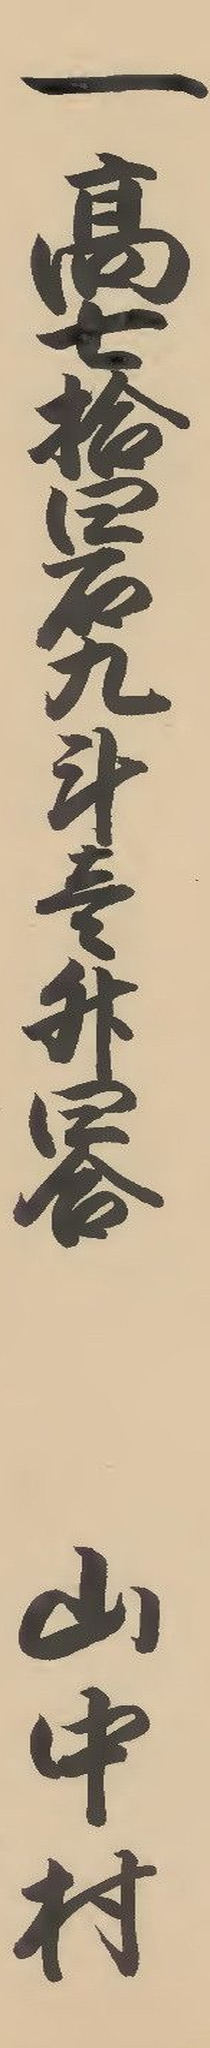一高七拾四石九斗壱升四合山中村
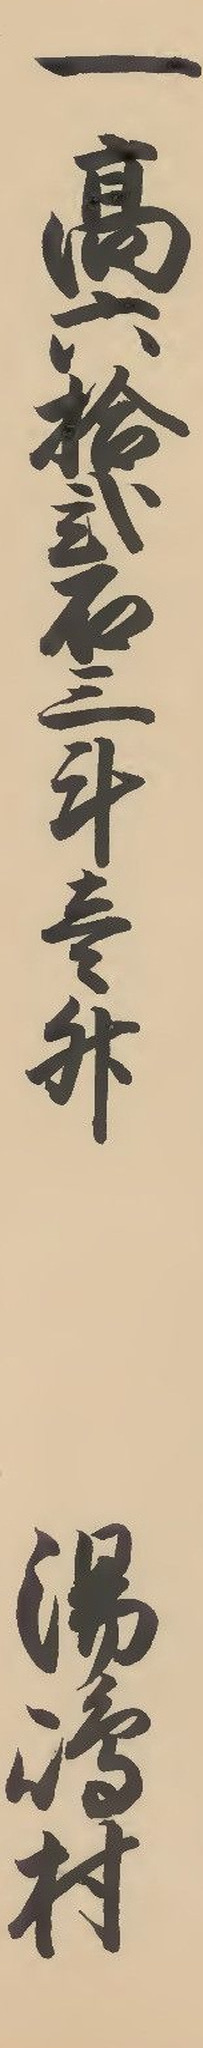一高六拾弐石三斗壱升湯島村
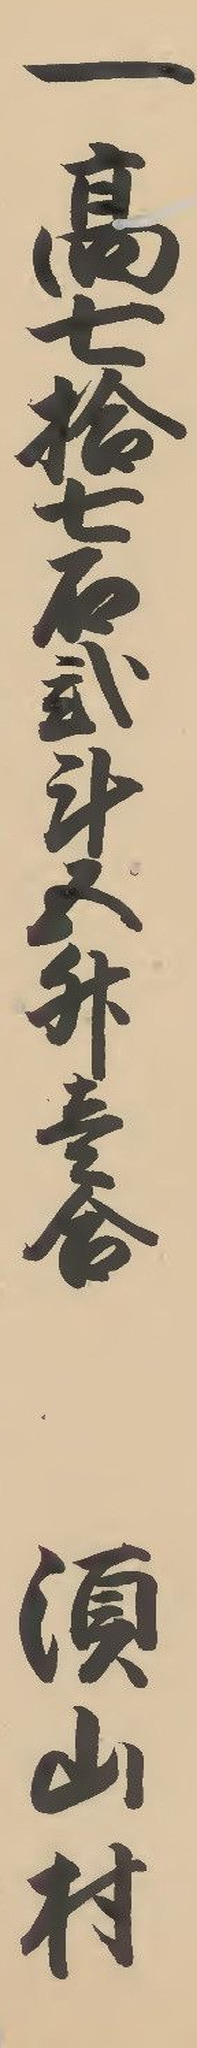一高七拾七石弐斗五升壱合須山村
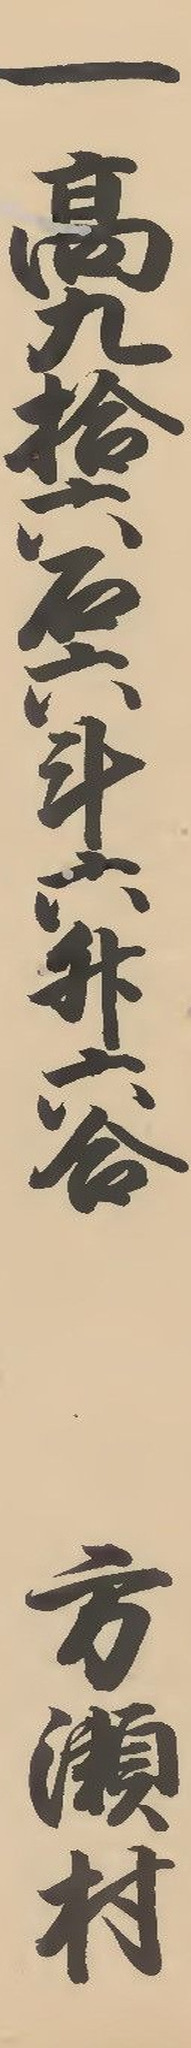一高九拾六石六斗六升六合方瀬村
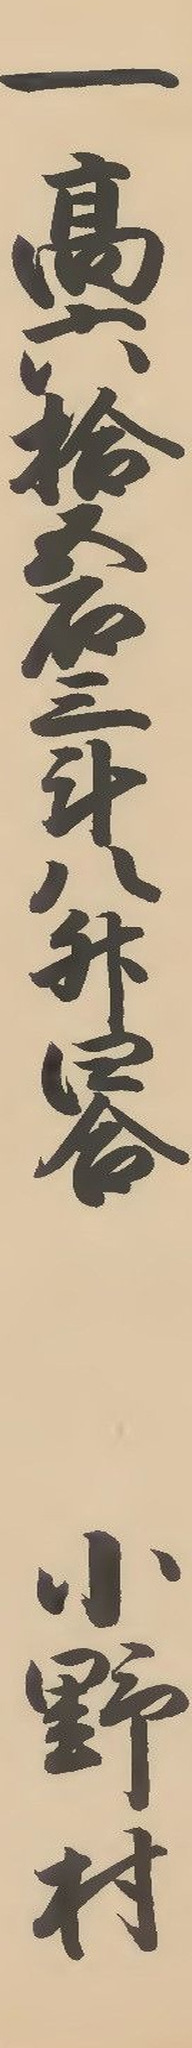一高六拾五石三斗八升四合小野村
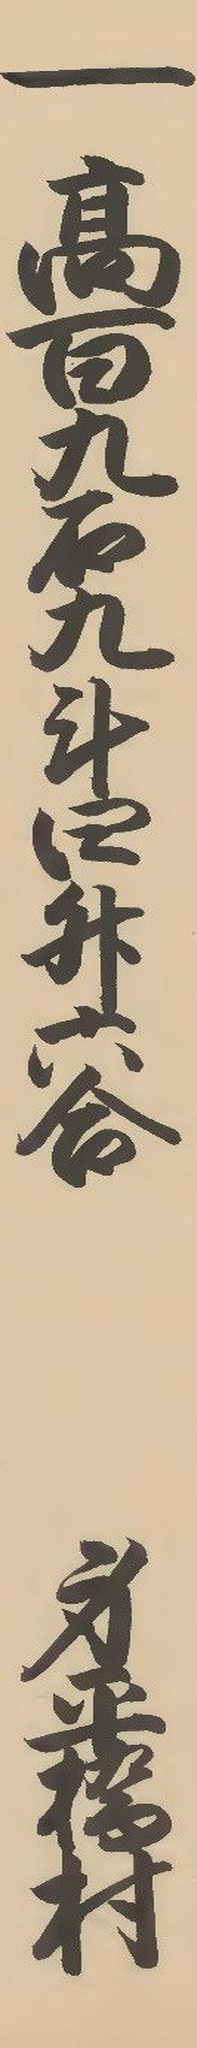一高百九石九斗四升六合身平橋村
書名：三河国郷帳
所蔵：国立公文書館 National Archives of Japan
